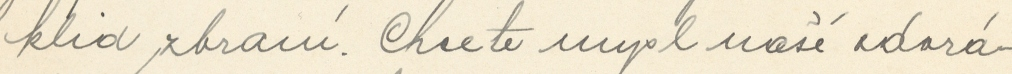klid zbraní. Chcete mysl naší odvrá-
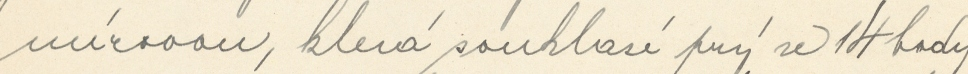mírovou, která souhlasí prý se 14 body
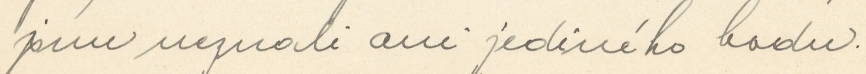jsme neznali ani jediného bodu.
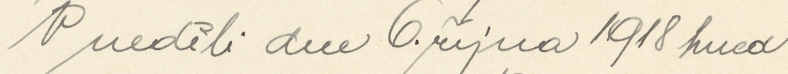V neděli dne 6. října 1918 hned
